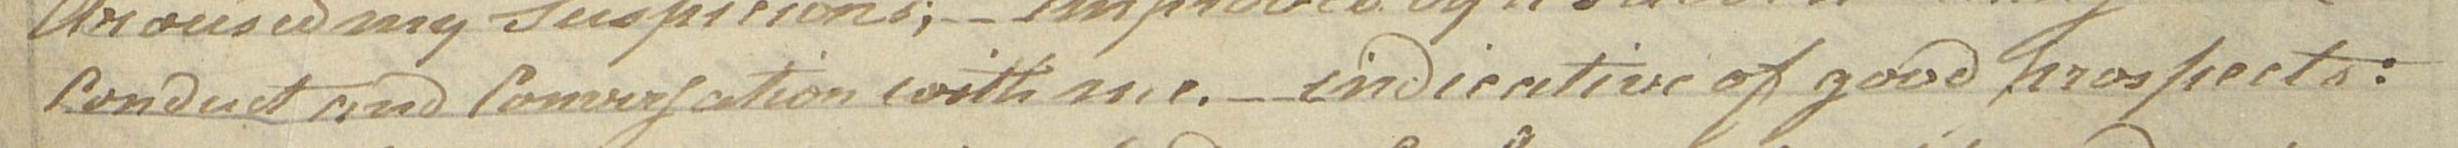conduct and Comursation with me. indicative of good prospects:
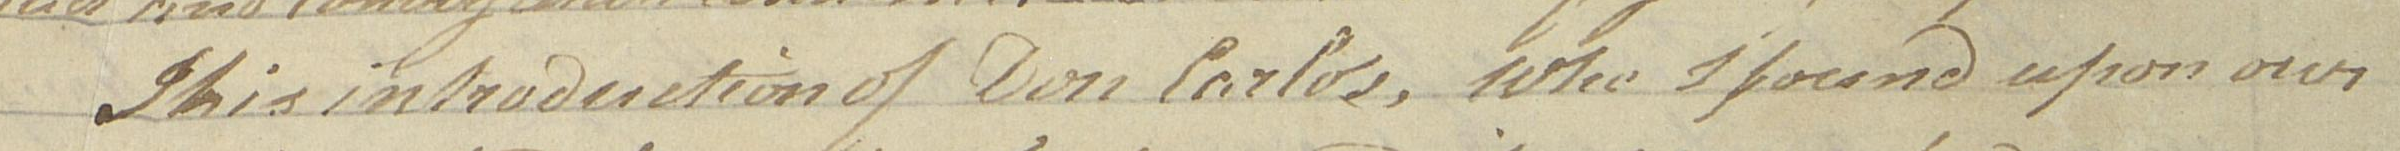This introduction of Don Carlos, Who I found upon our
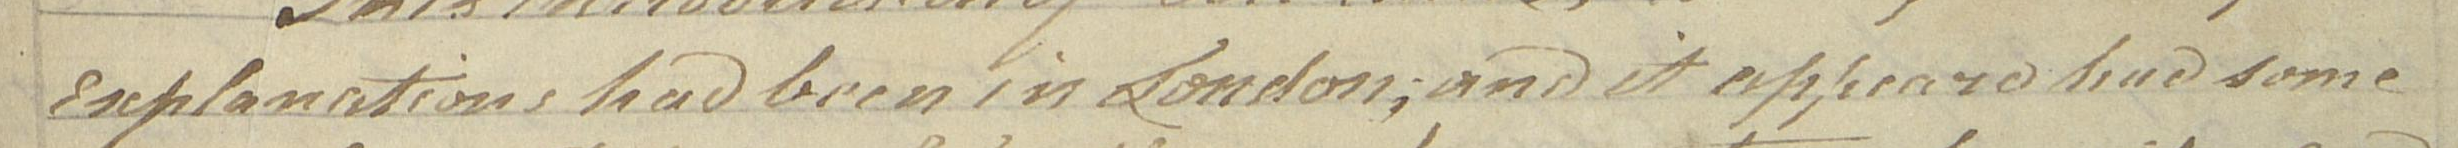explanations had been in London; and it appeared had some
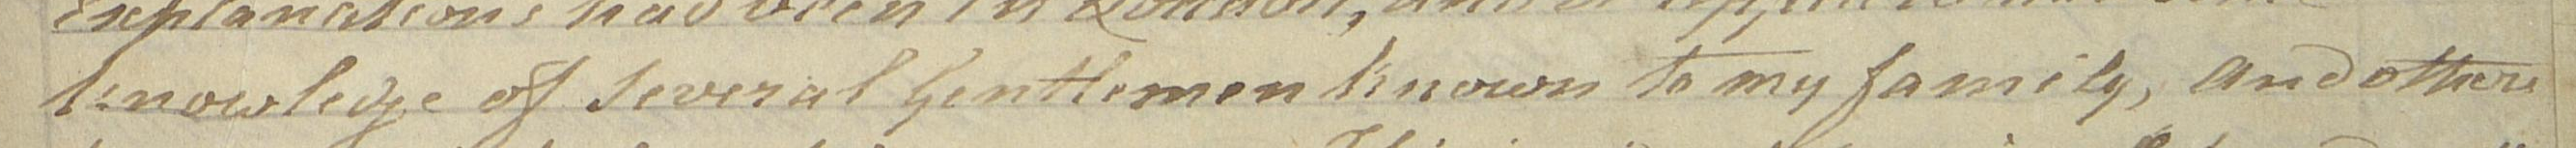knowledge of several Gentlemen known to my family, and other
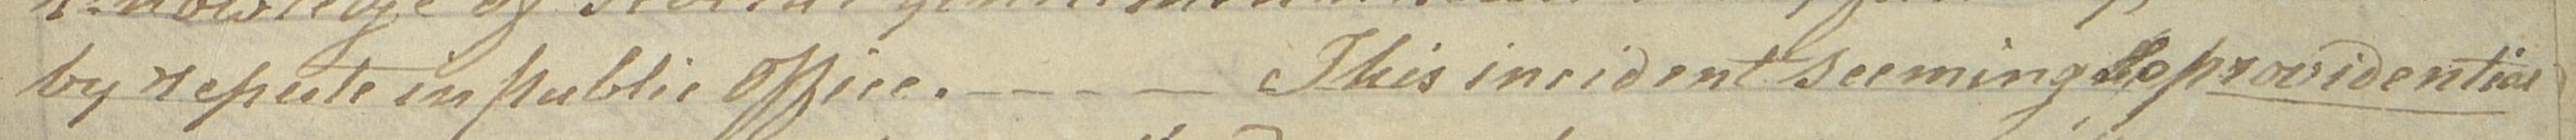by repute to in public Office. This incident seeming so providential
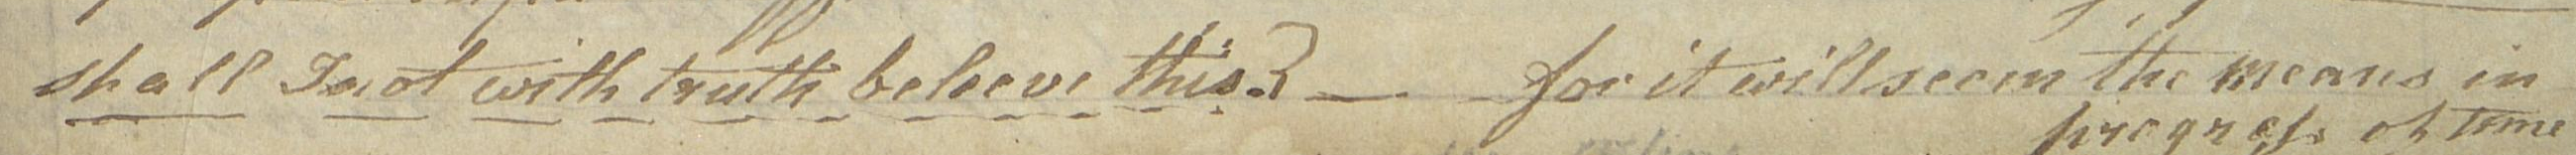shall I not with truth believe this? for it will seem the means in
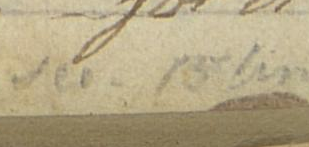see 15 line
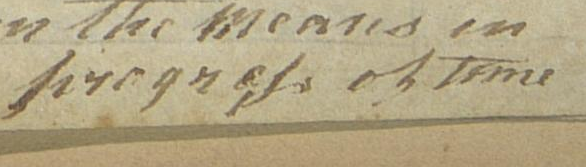progress of time
